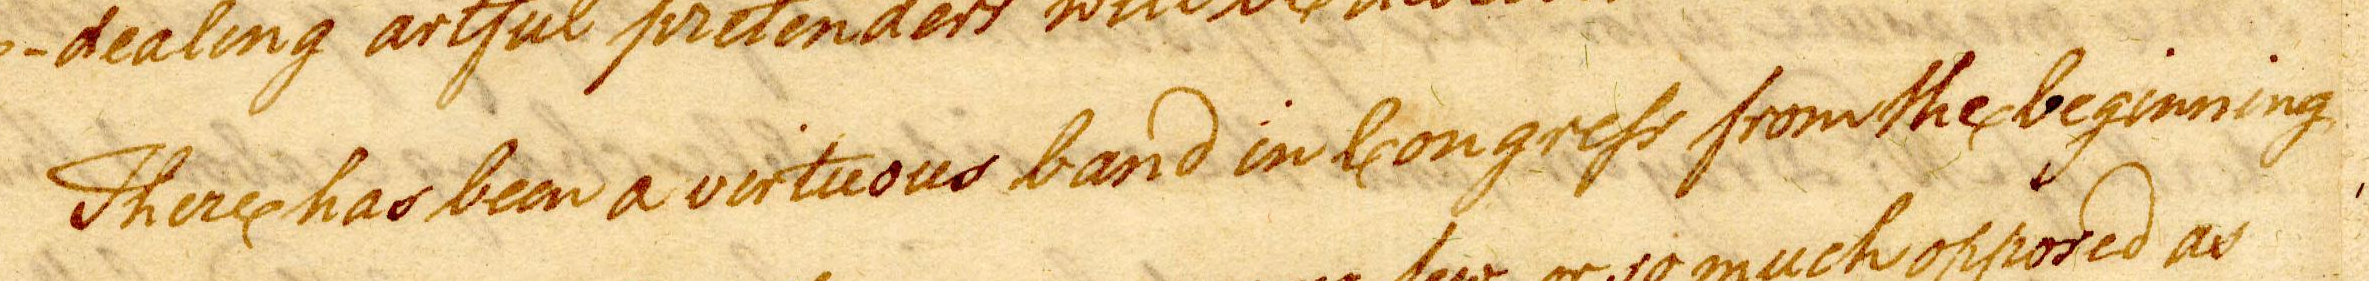There has been a virtuous band in Congress from the beginning
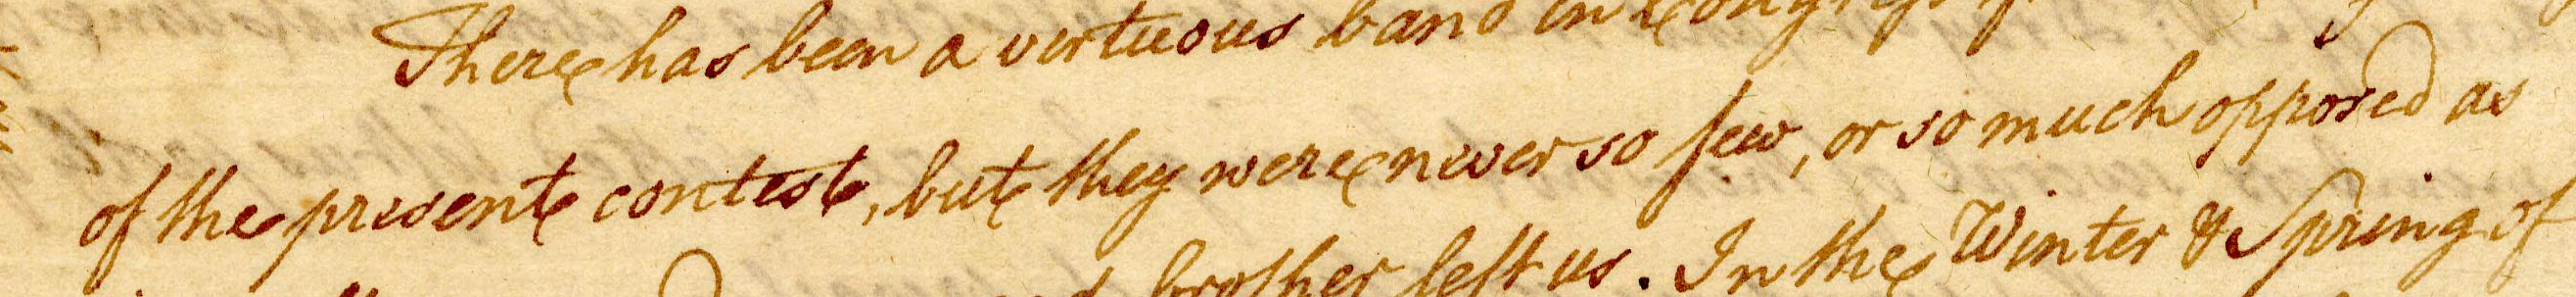of the present contest, but they were never so few, or so much opposed as
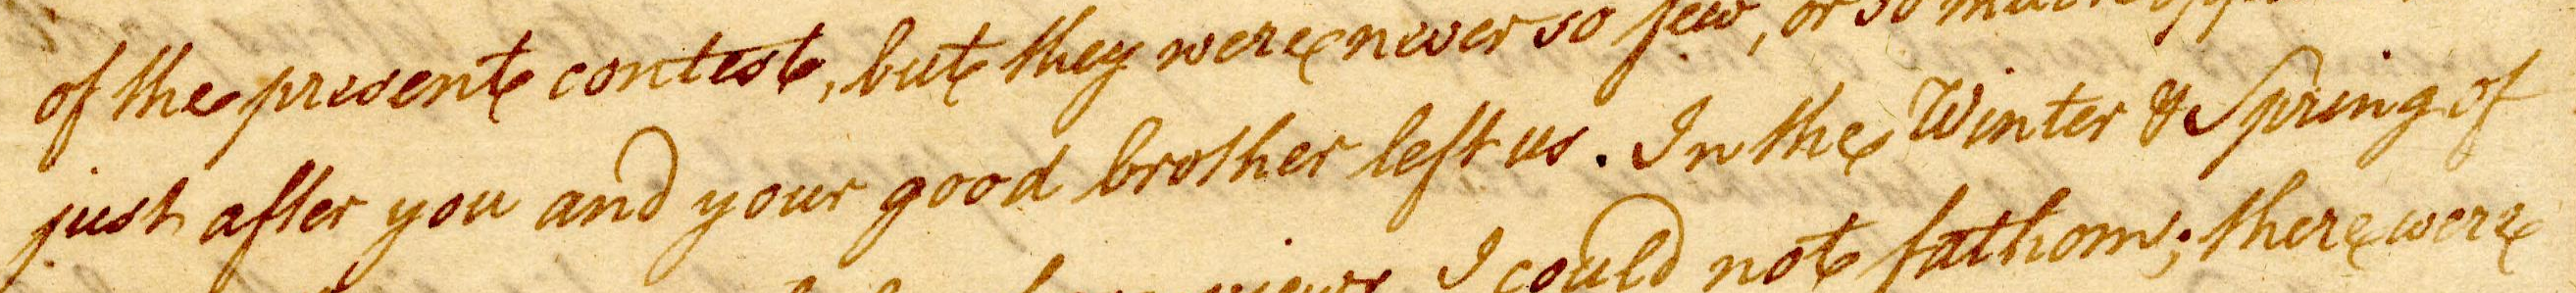just after you and your good brother left us. In the Winter & Spring of
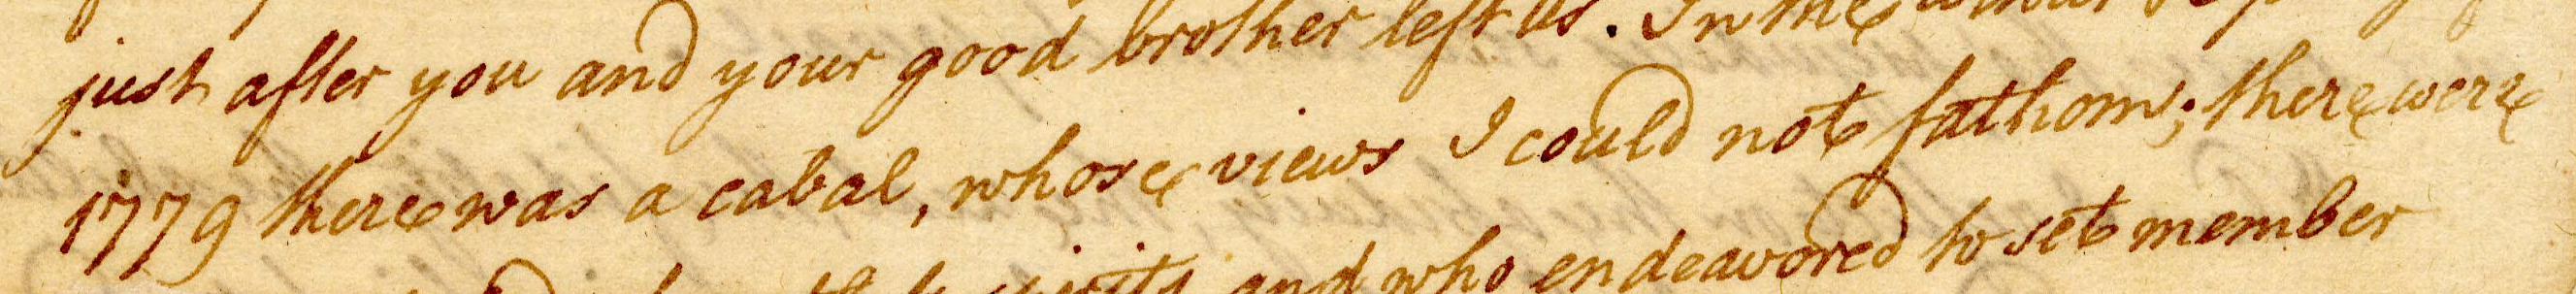1779 there was a cabal, whose views I could not fathom; there were
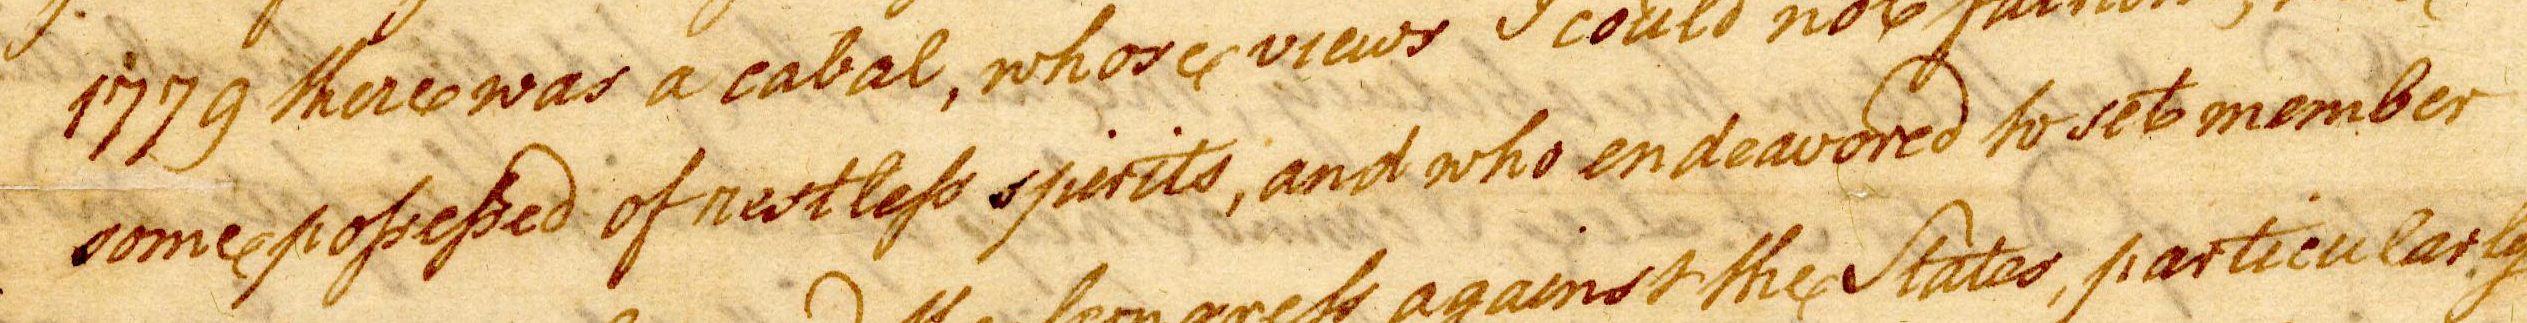some possessed of restless spirits, and who endeavored to set member
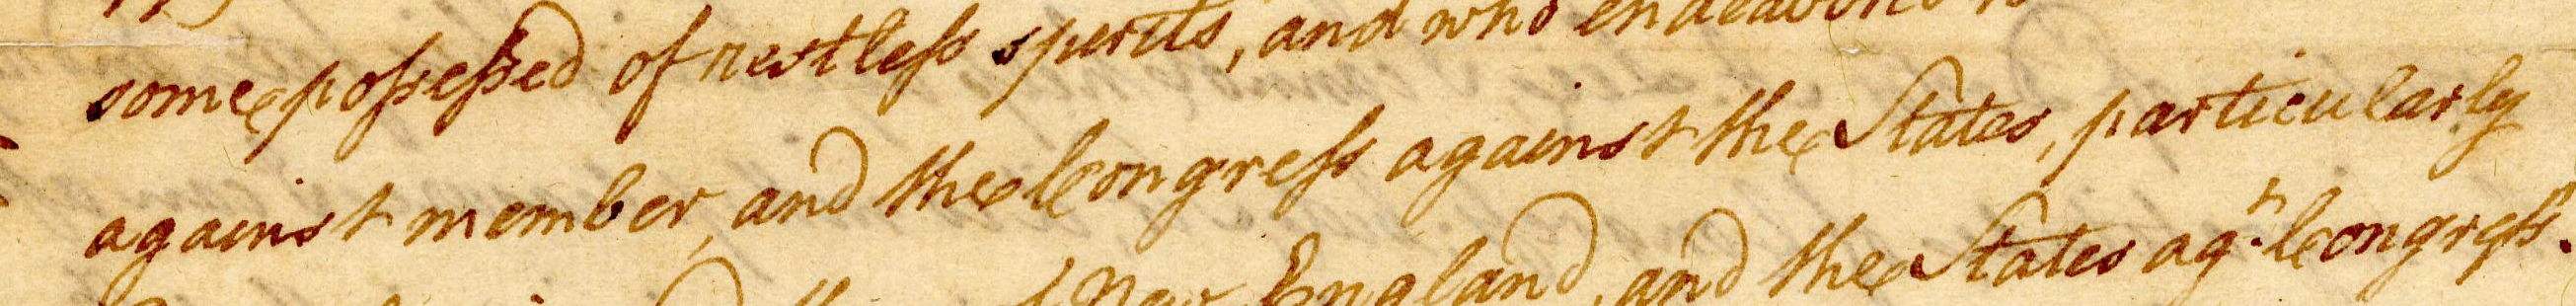against member and the Congress against the States, particularly
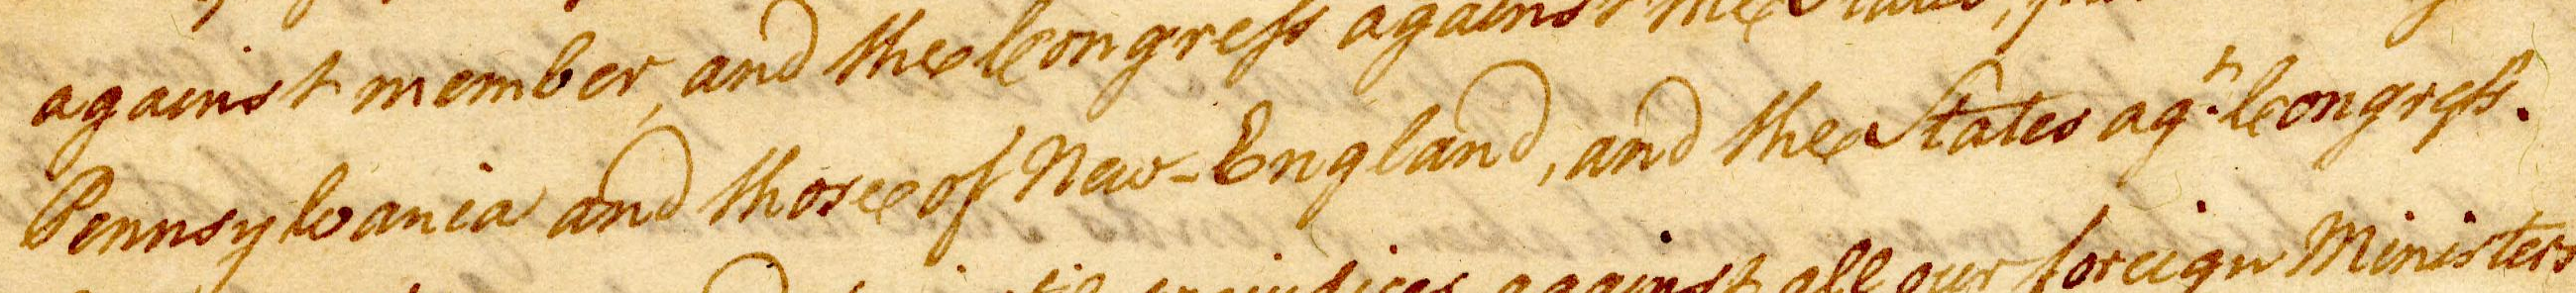Pennsylvania and those of New-England, and the States ag^t. Congress.
